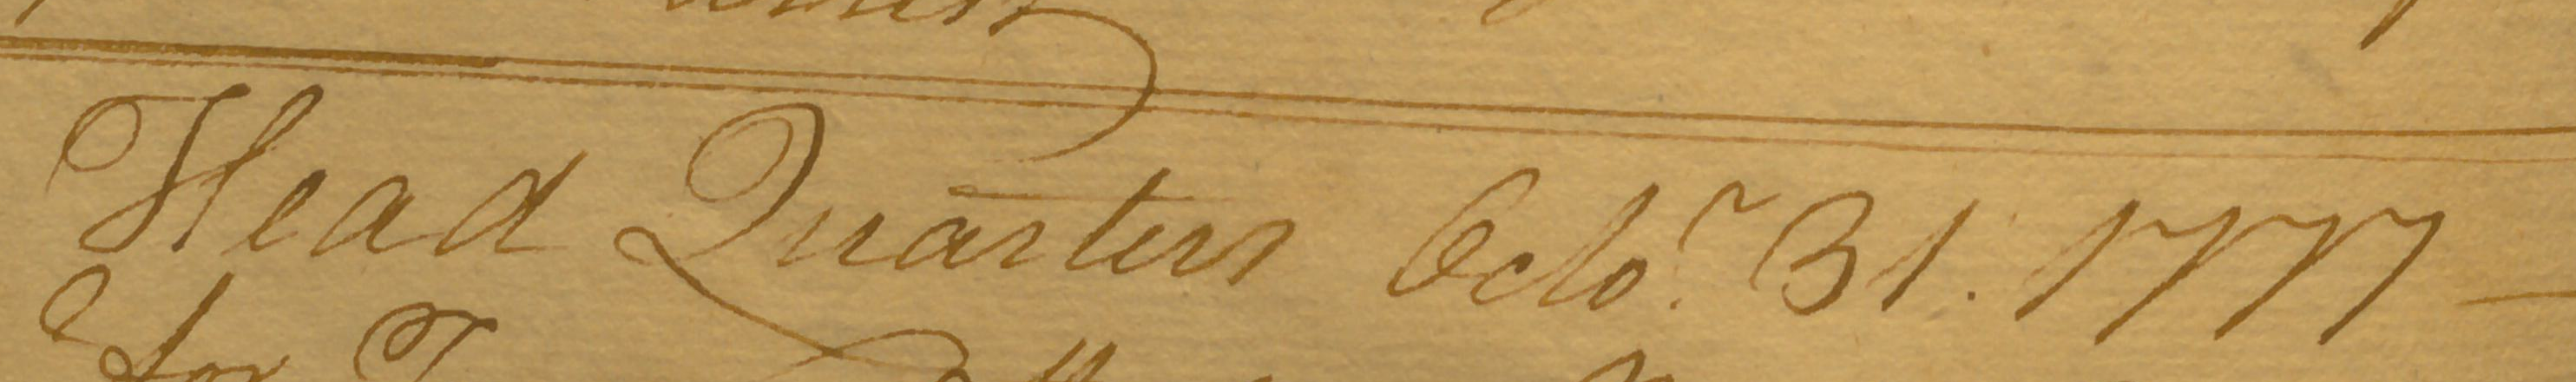Head Quarters Octo^r. 31. 1777-
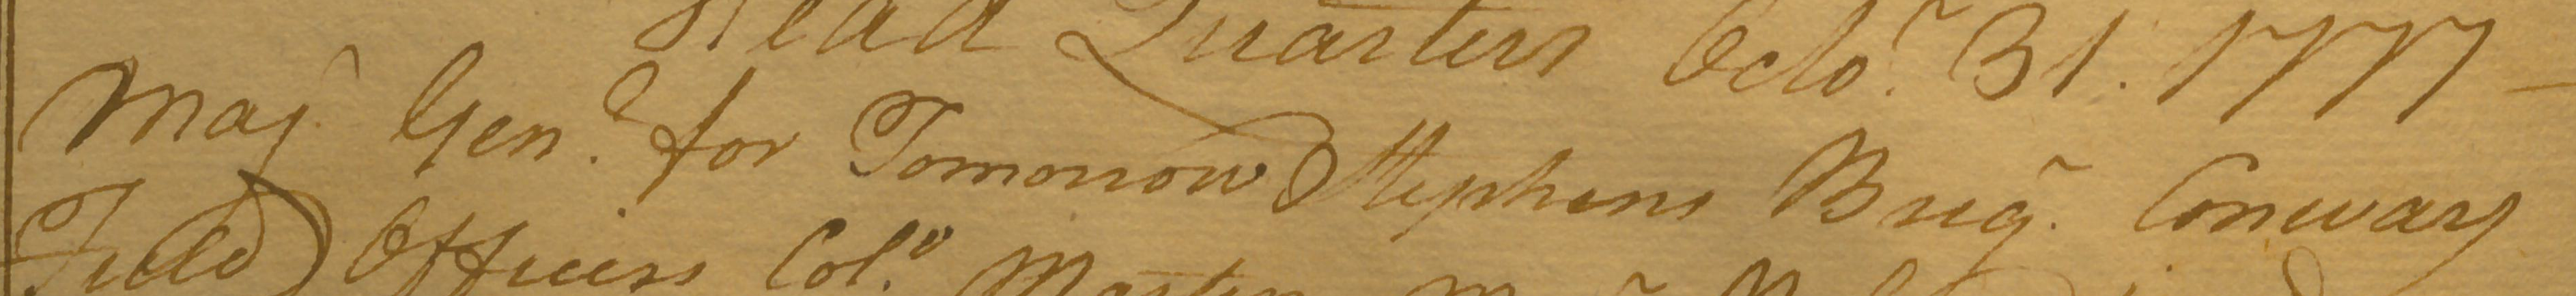Maj^r. Gen^l. for Tomorrow Stephens Brig^r. Conway
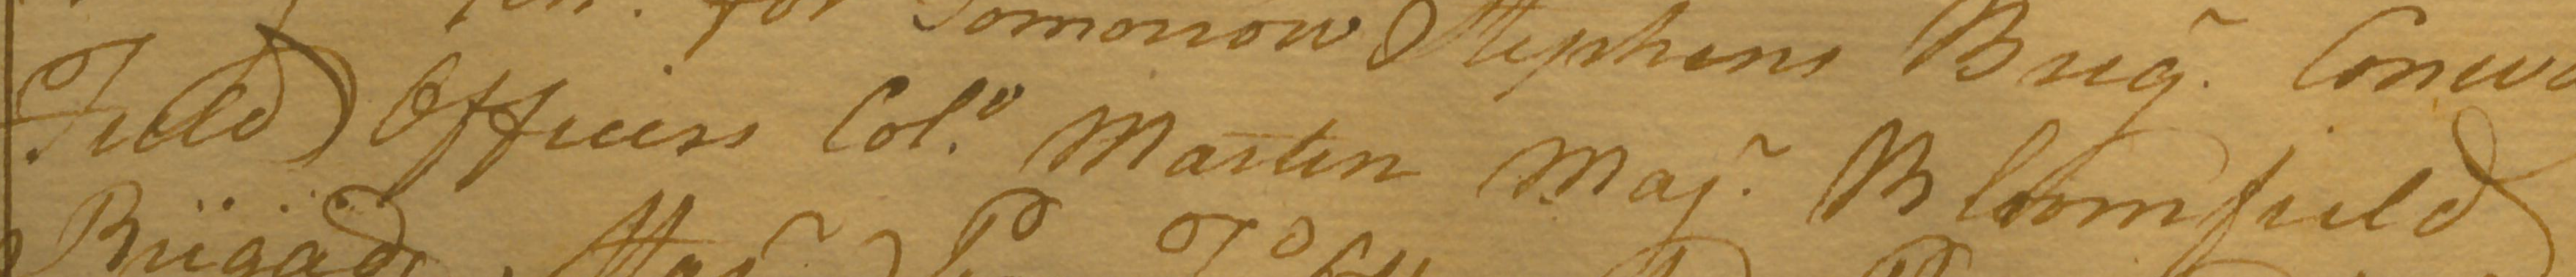Field Officers Col^O. Martin Maj^r. Bloofield
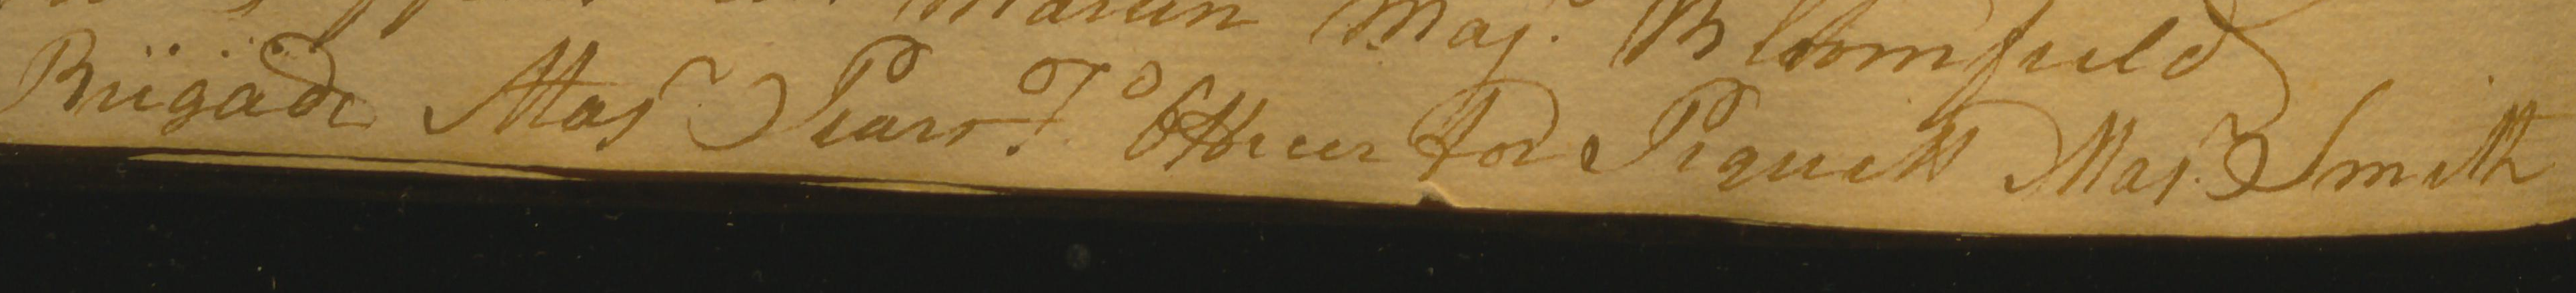Brigade Maj^r. Pears F^d. Officer for Picquets Maj^r. Smith
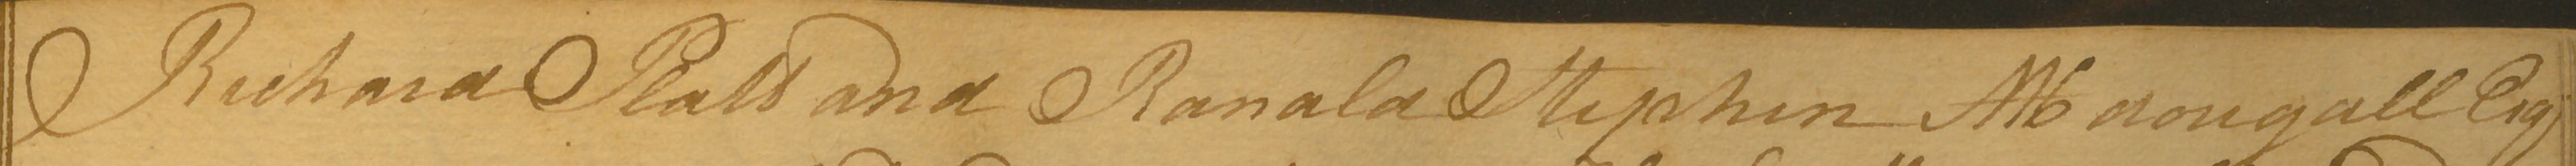Richard Pealls and Ranald Stephen MCdougall Esq
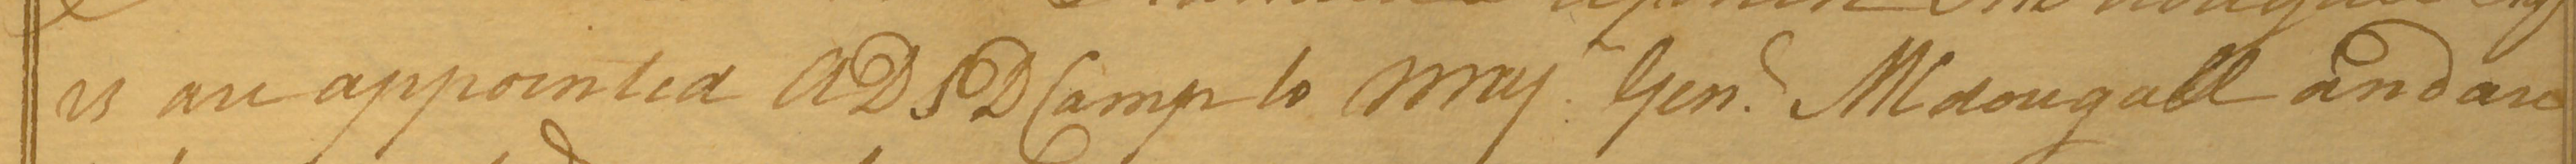rs are appointed AD & D Camp to Maj^r: Gen^l. MCdougall and are
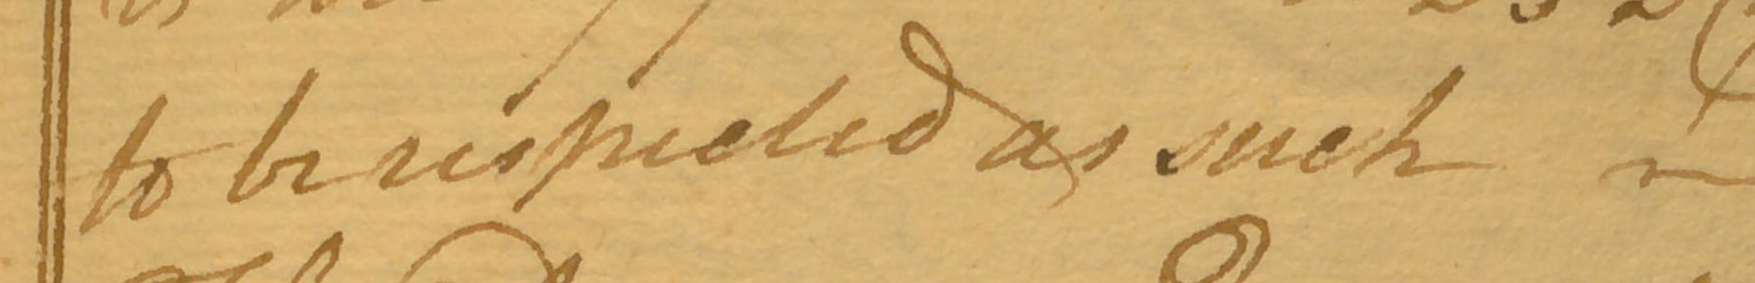to be respected as such-
